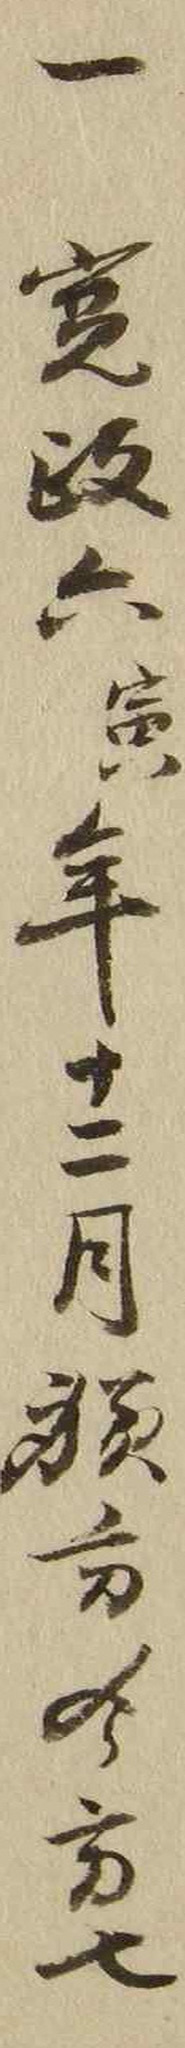一寛政六寅年十二月躾方〆り方七
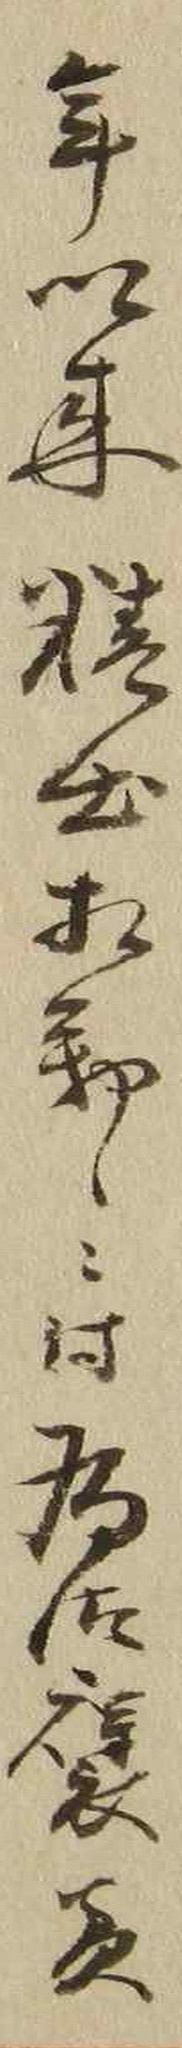年以来精出相勤候ニ付為御褒美
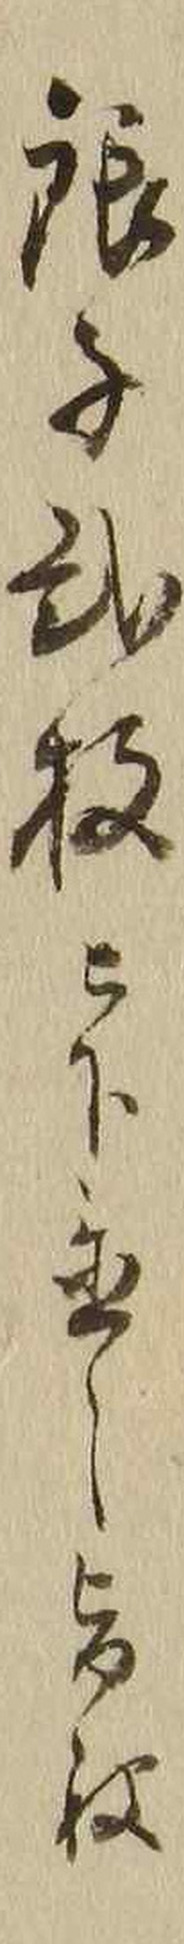銀子弐枚被下置之旨被
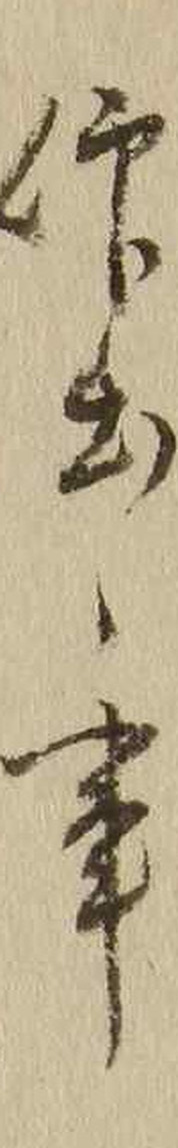仰出候事
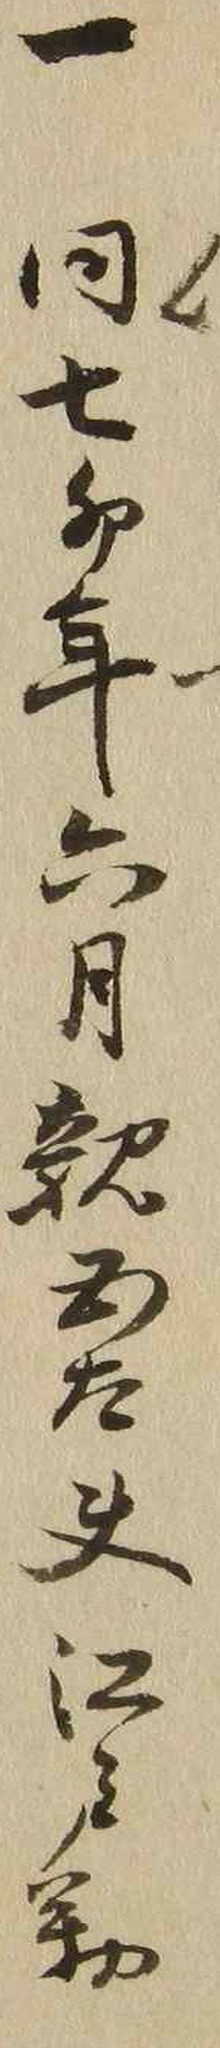一同七卯年六月親五太夫江戸勤
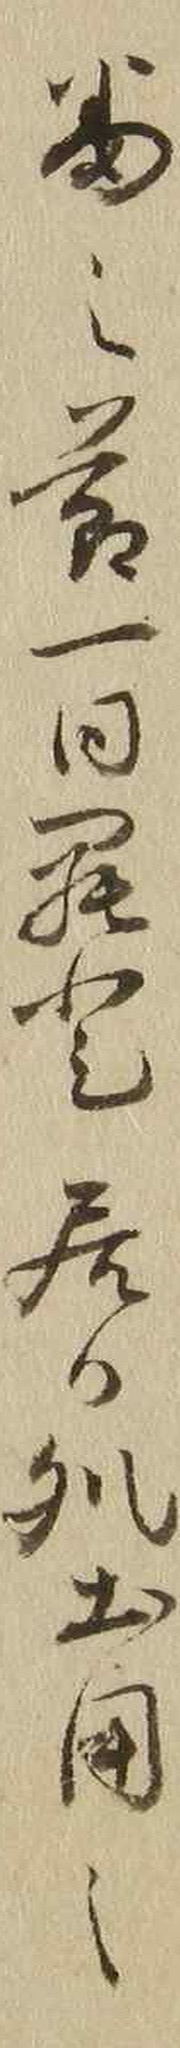番之節一同罷登居候処土用之
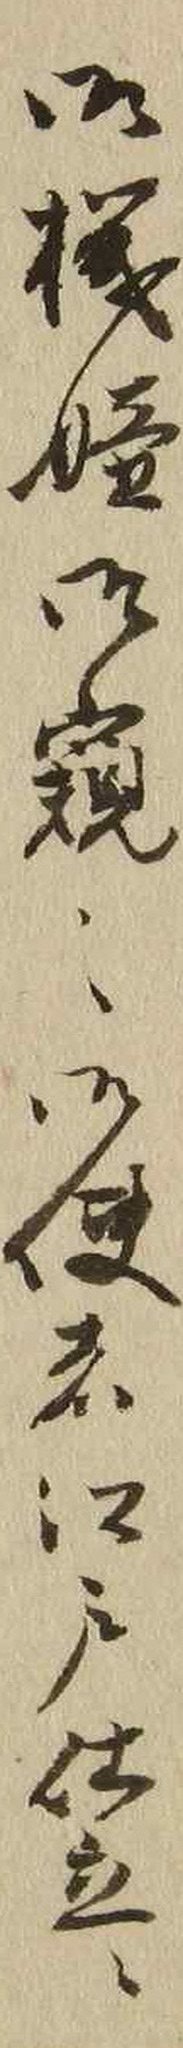御機嫌御窺之御使者江戸仕立ニ
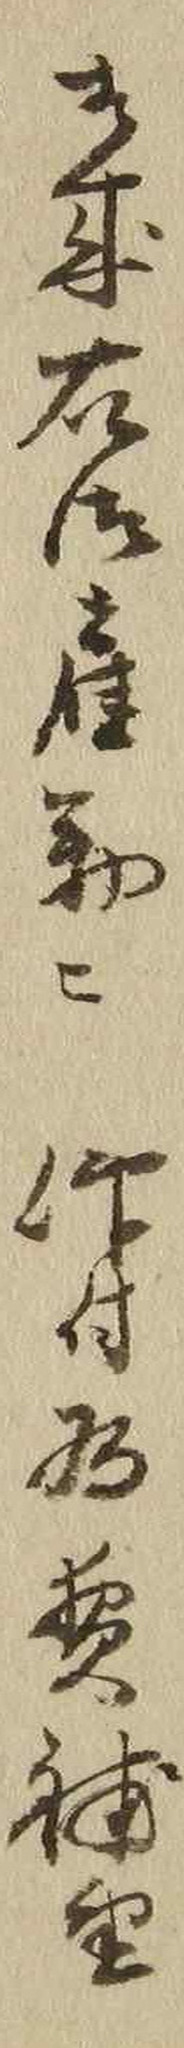相成右御雇勤被仰付為費補金
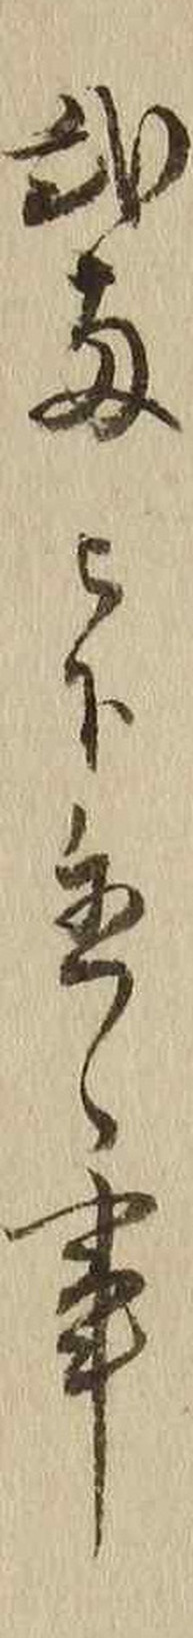弐両被下置候事
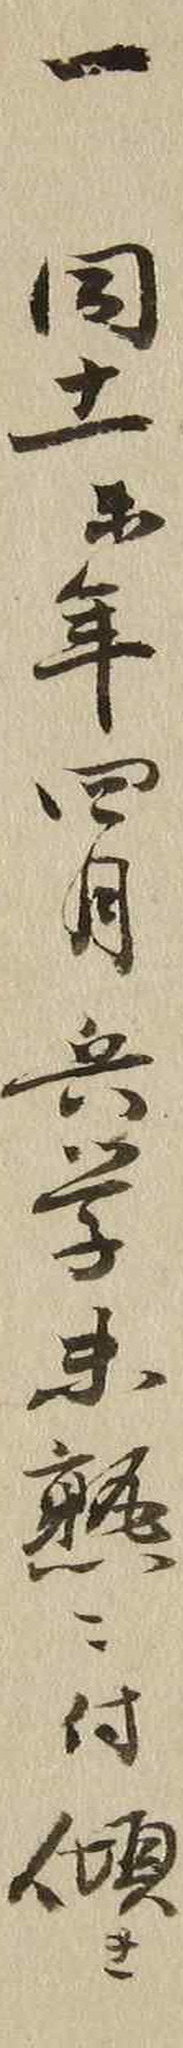一同十一未年四月兵学未熟ニ付傾き
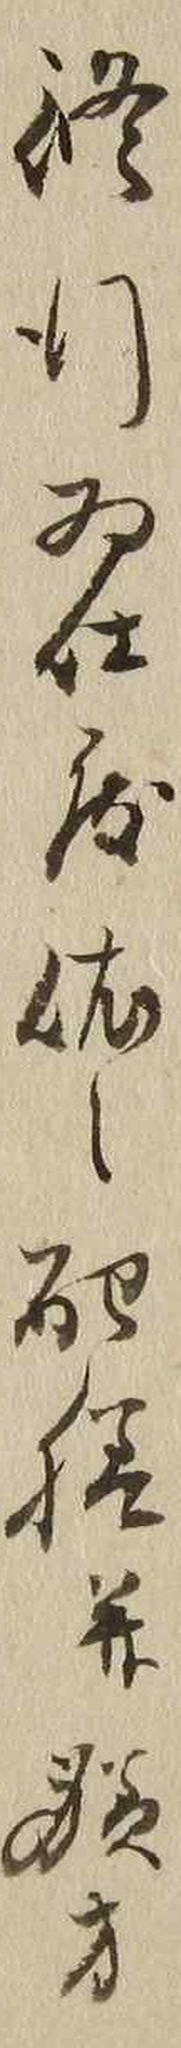修行為仕度依之配膳并躾方
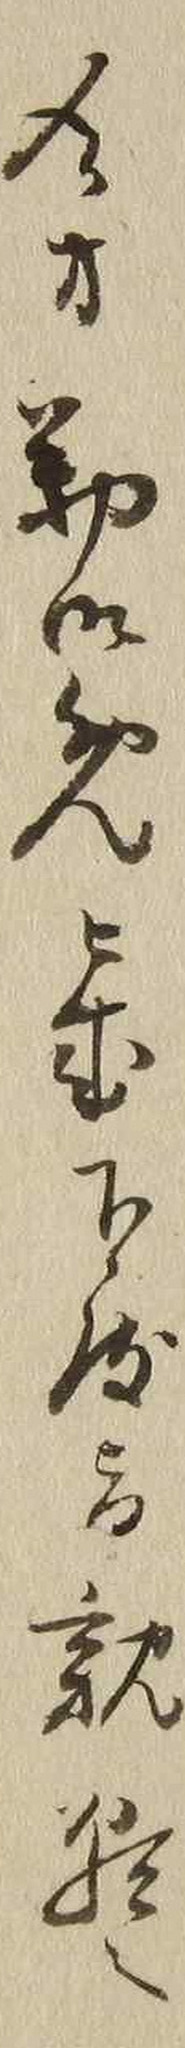〆り方勤御免被成下度旨親願之
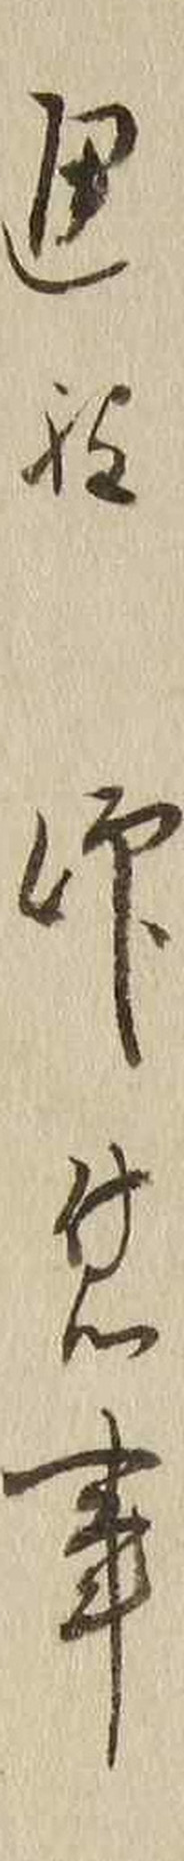通被仰付候事
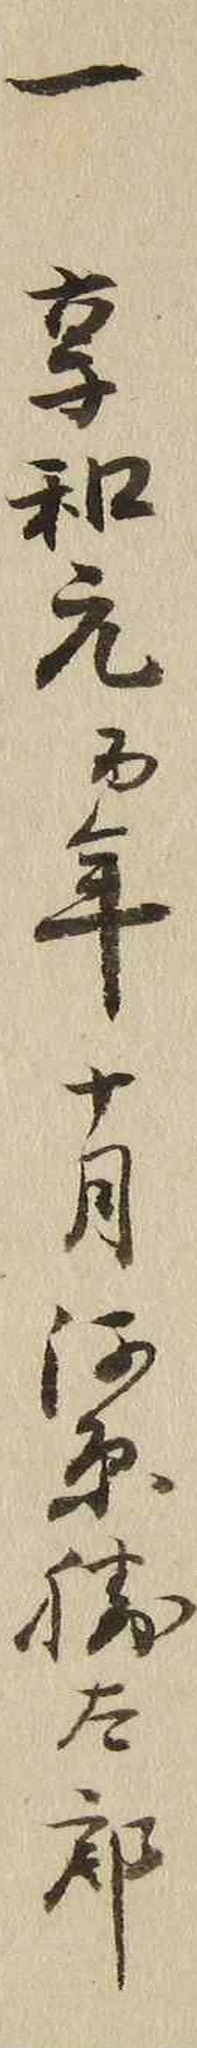一享和元酉年十月河原勝太郎
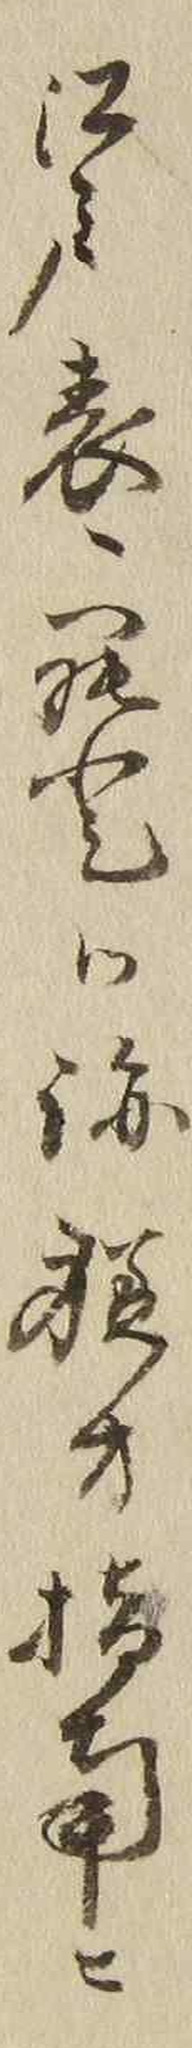江戸表へ罷登候跡躾方指南被
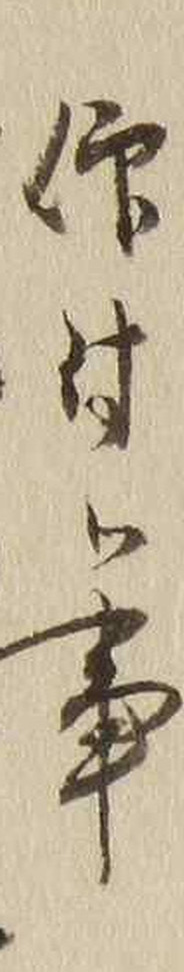仰付候事
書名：諸士系譜　巻之225　ま之部6
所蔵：会津若松市立会津図書館
